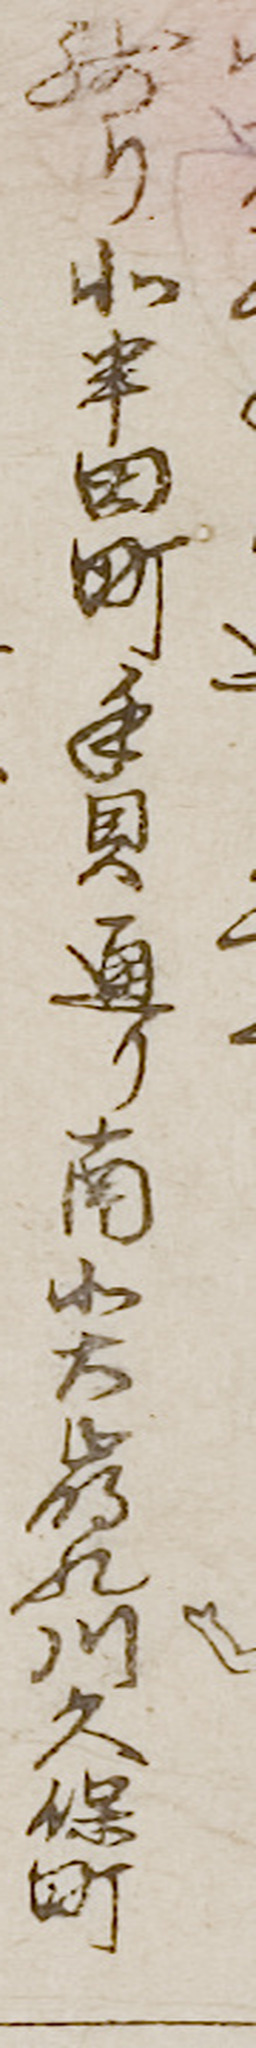残り北半田町手貝通り南北大崩れ川久保町
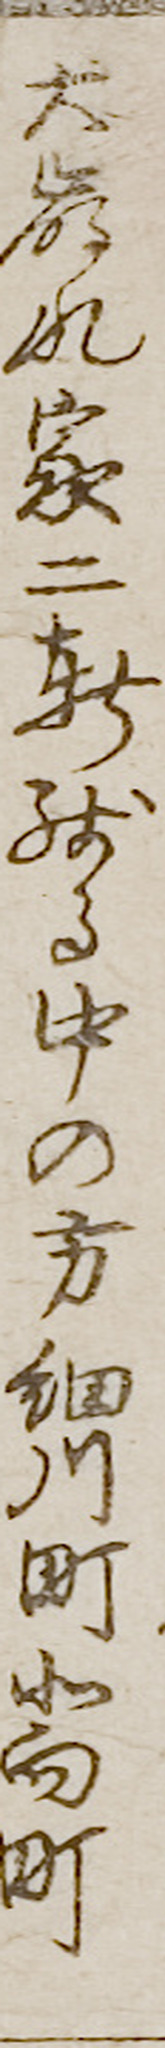大崩れ家二軒残る中の方細川町北向町
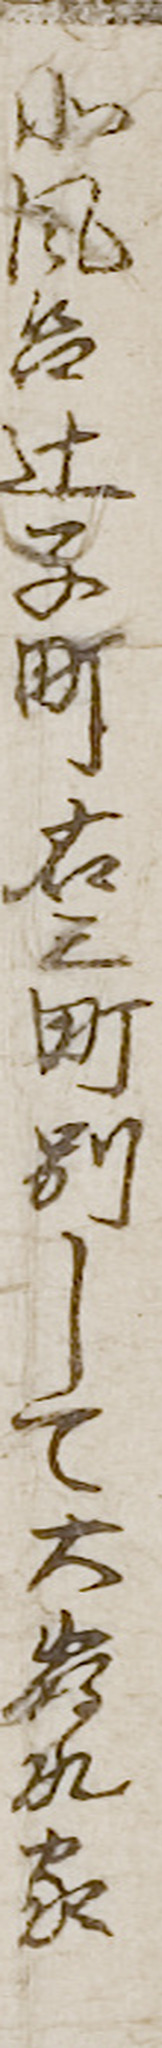北風呂辻子町右三町別して大崩れ家
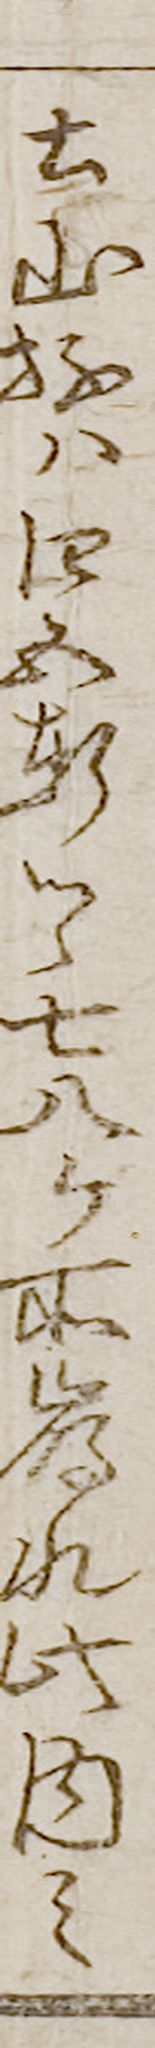土山等は四五軒つゝ七八ヶ所崩れ此内之
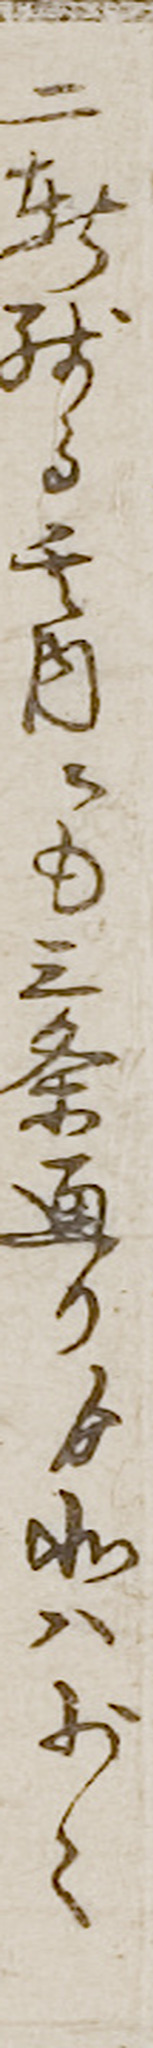二軒残る其内にも三条通りより北は少々
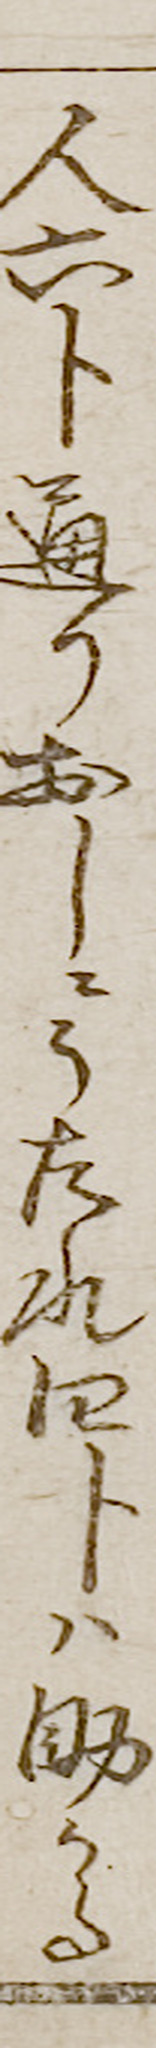人六分通りおしにうたれ四分は助かる
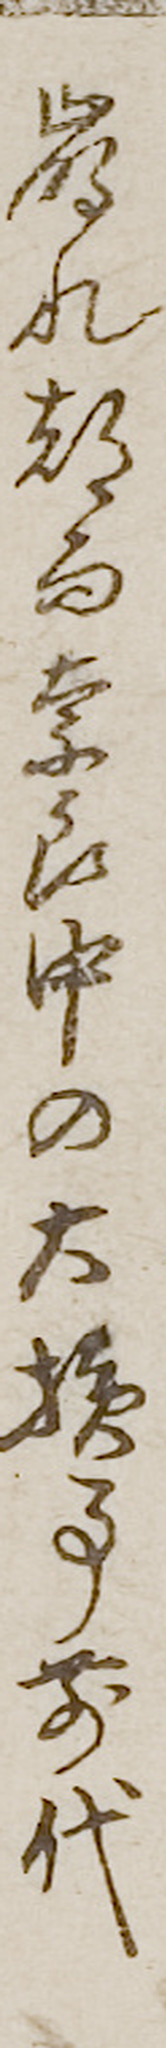崩れ都而奈良中の大損事前代
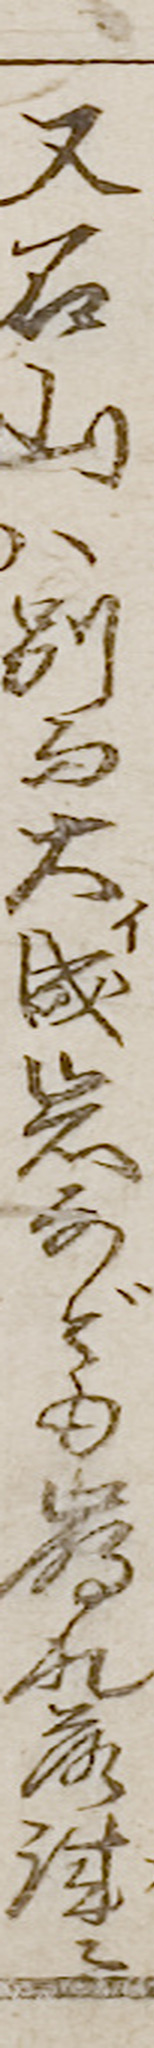又石山は別て大イ成岩なども崩れ落誠に
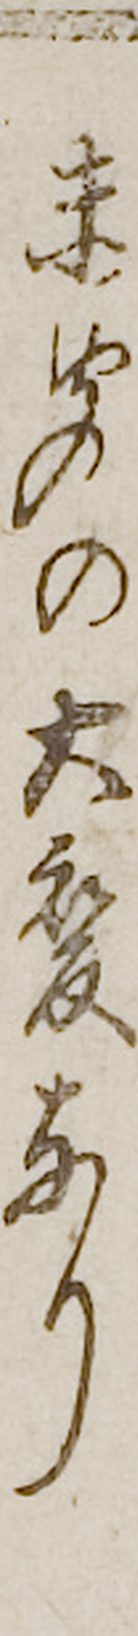未聞の大変なり
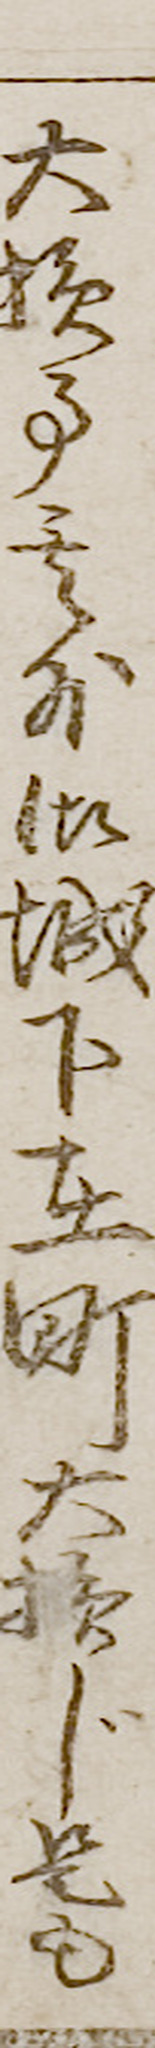大損事其外御城下在町大損じ是も
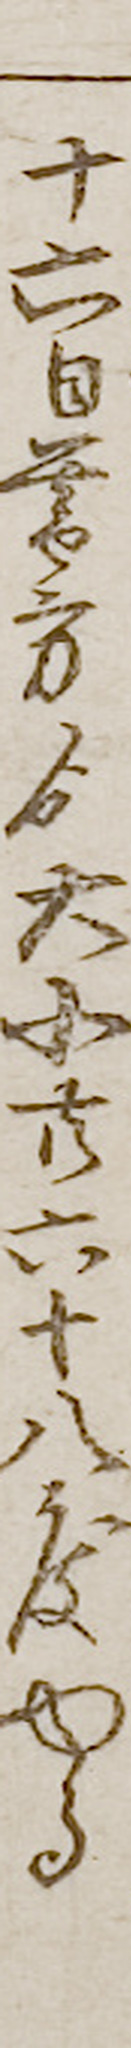十六日暮方より大小共六十八度ゆる
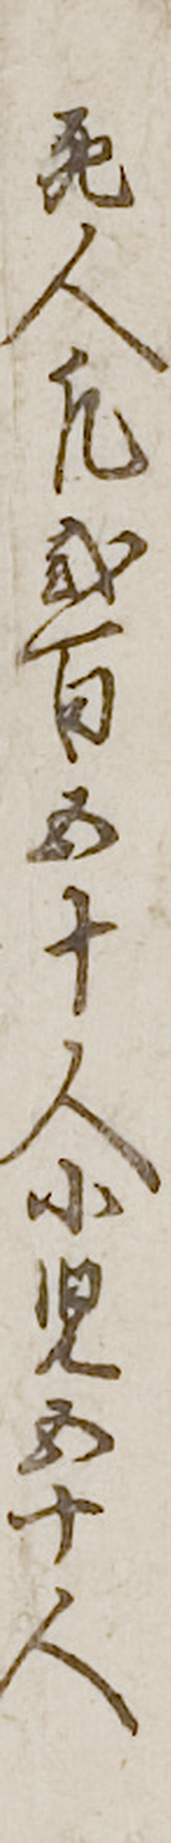死人凡弐百五十人小児五十人
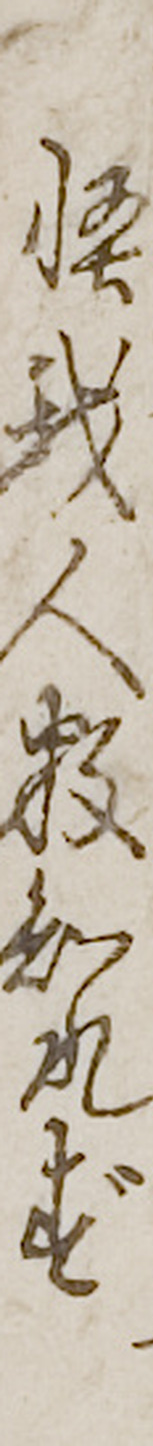怪我人数知れず
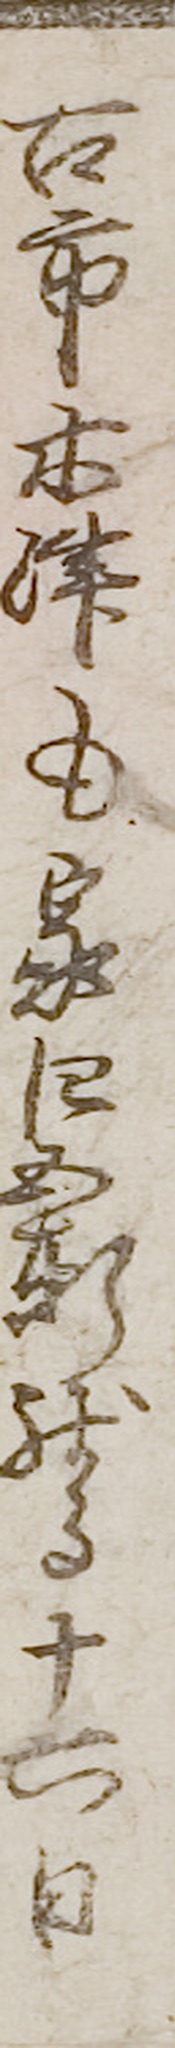古市木津も家四五軒残る十六日
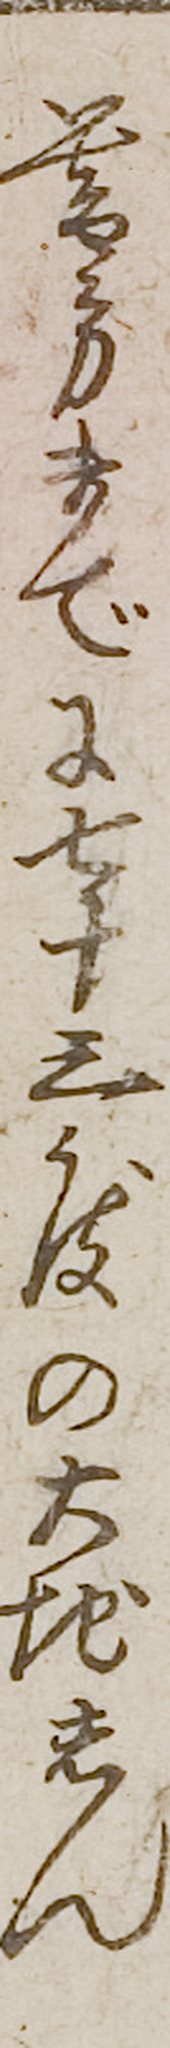暮方までに七十三度の大地しん
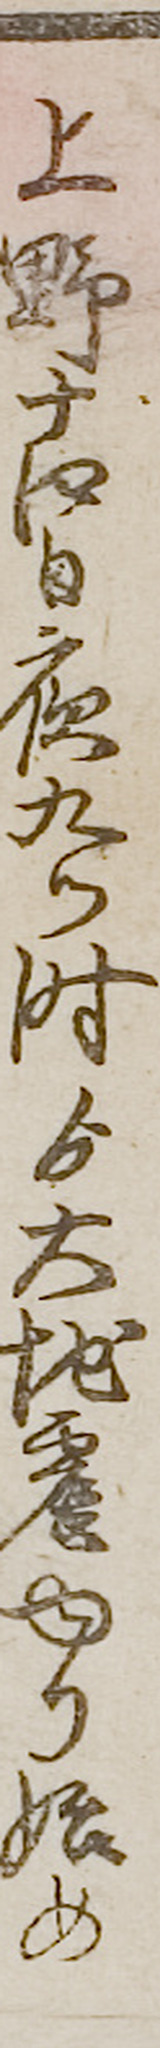上野十四日夜九ッ時より大地震ゆり始め
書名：聞書諸国大地震并出火
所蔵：東京大学総合図書館 General Library in the University of Tokyo, JAPAN
